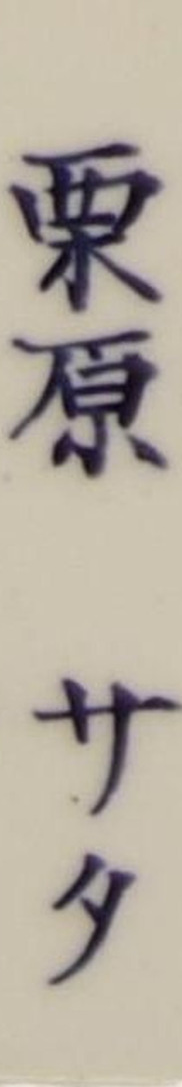栗原サタ
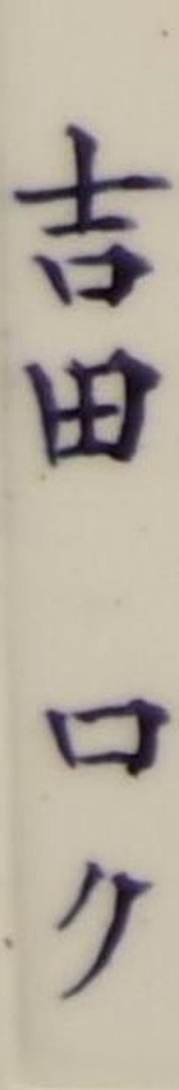吉田ロク
